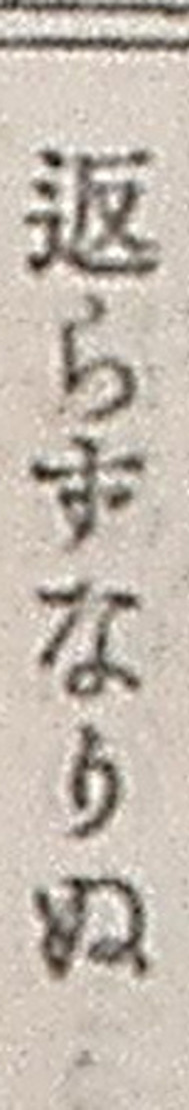返らずなりぬ
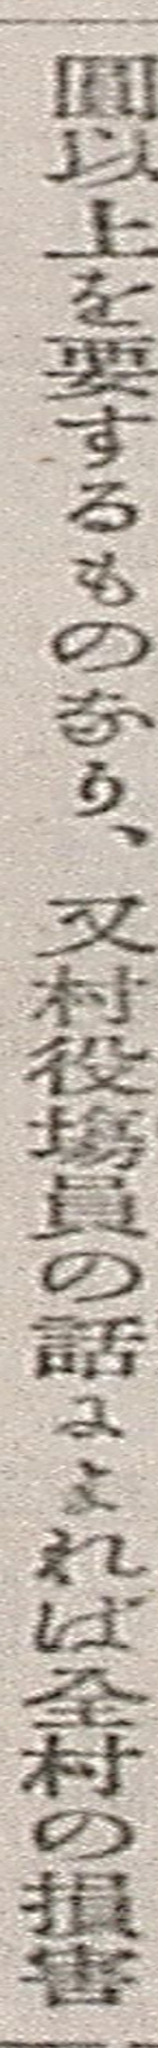円以上を要するものなり、又村役場員の話によれば全村の損害
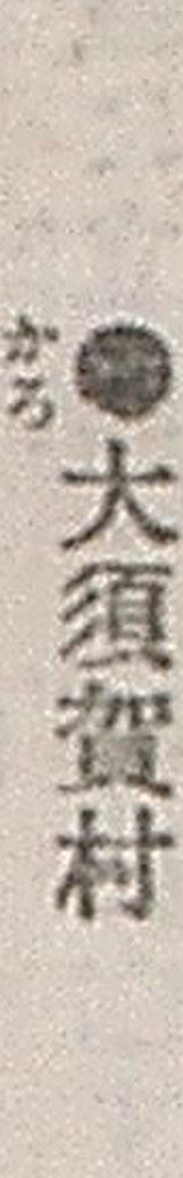●大須賀村
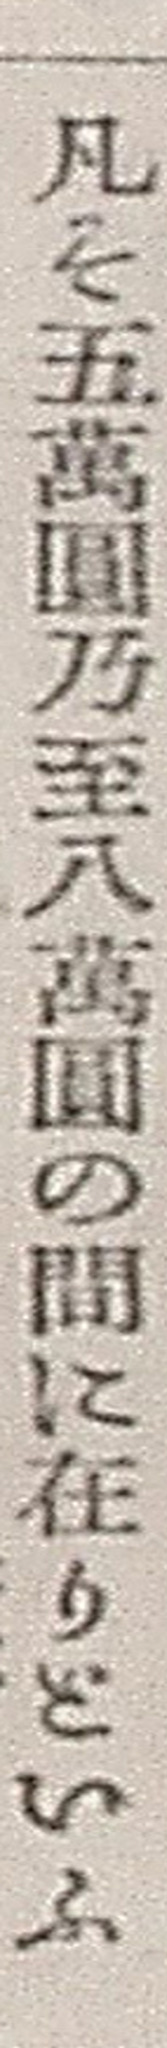凡そ五万円乃至八万円の間に在りといふ
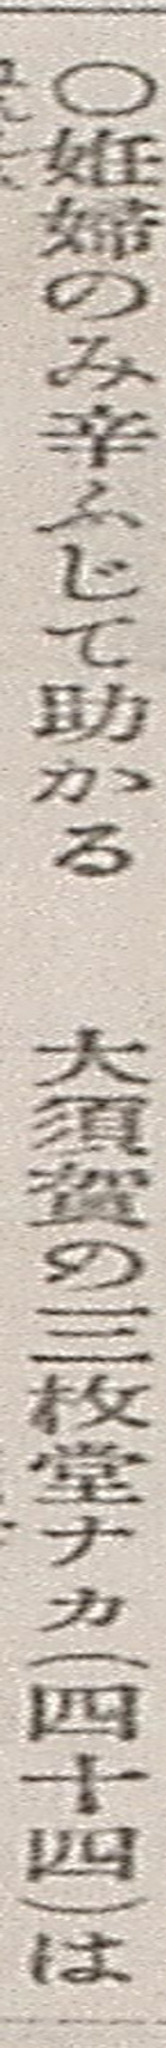〇妊婦のみ辛ふじて助かる大須賀の三枚堂ナカは
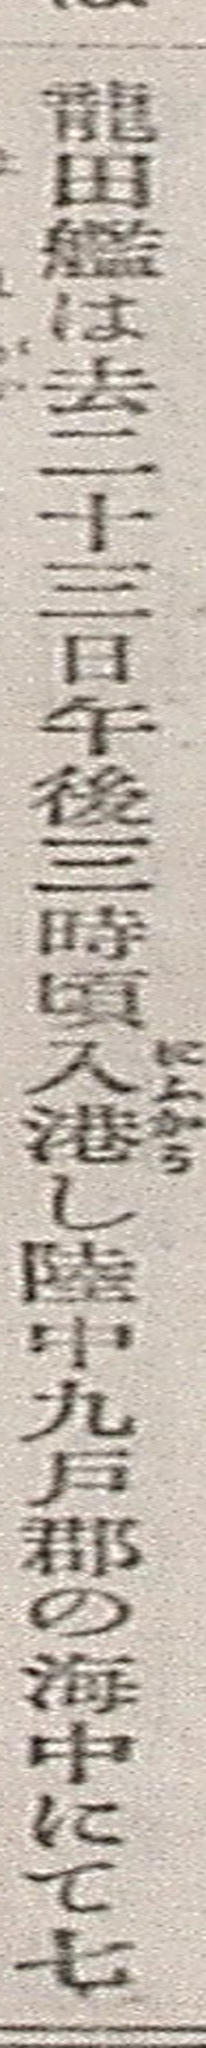龍田艦は去二十三日午後三時頃入港し陸中九戸郡の海中にて七
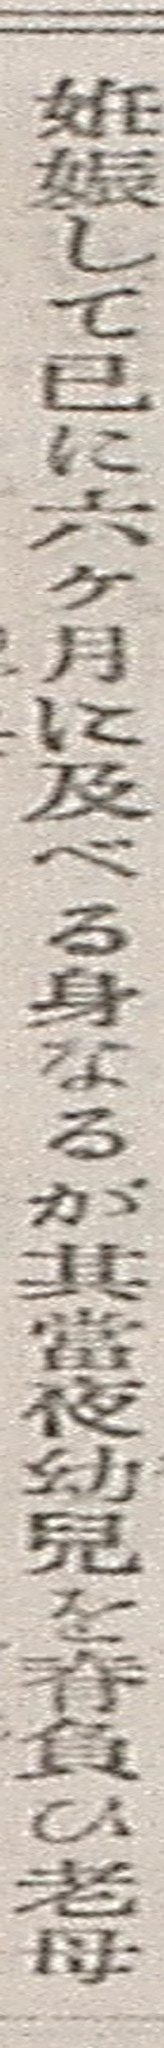妊娠して已に六ケ月に及べる身なるが其当夜幼児を背負ひ老母
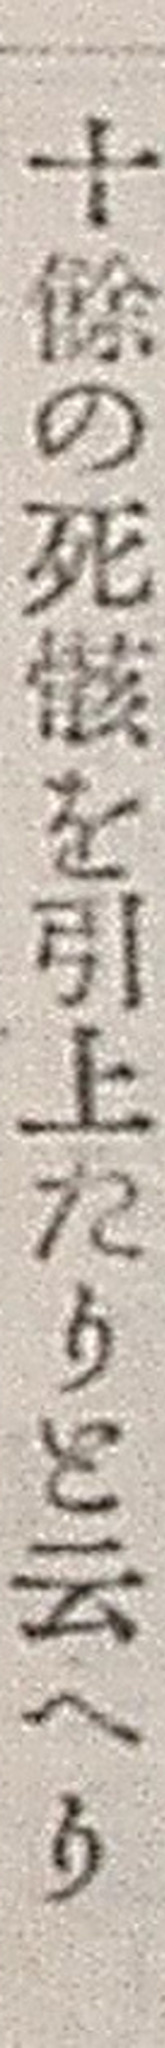十余の死骸を引上たりと云へり
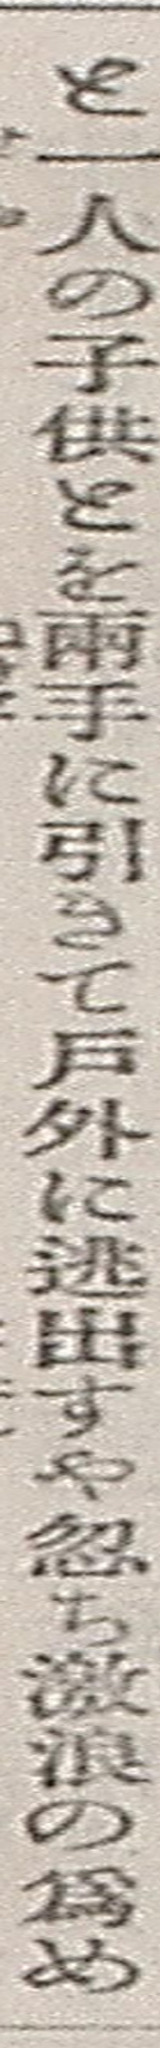と一人の子供とを両手に引きて戸外に逃出すや忽ち激浪の為め
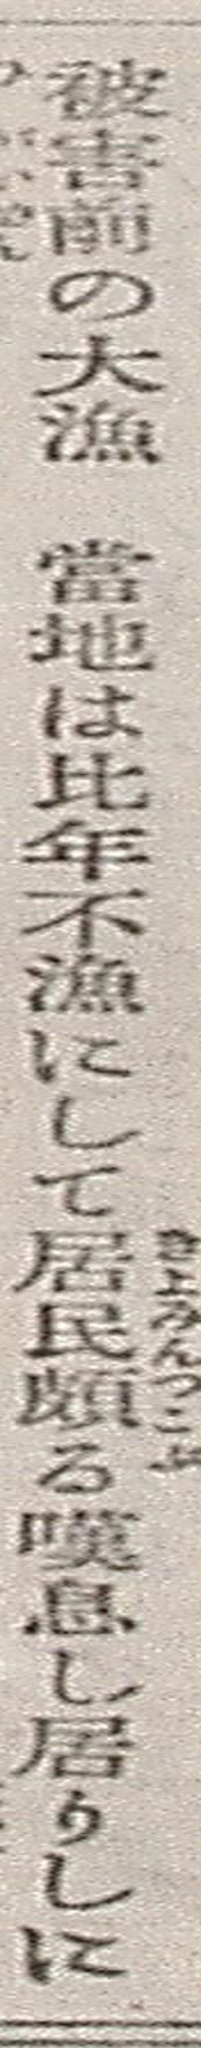被害前の大漁当地は比年不漁にして居民頗る嘆息し居りしに
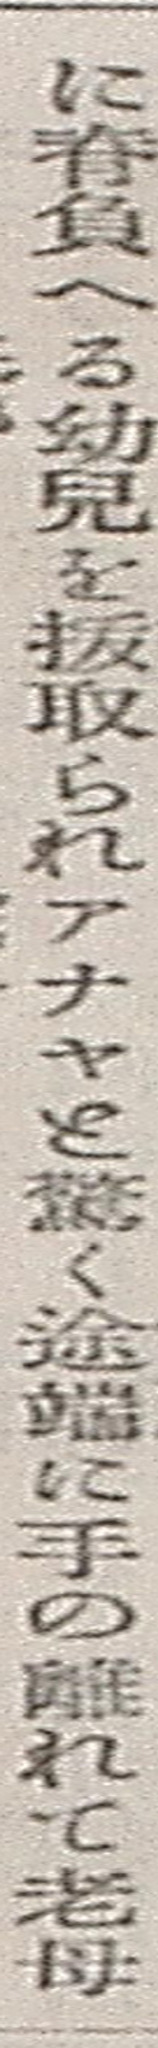に背負へる幼児を抜取られアナヤと驚く途端に手の離れて老母
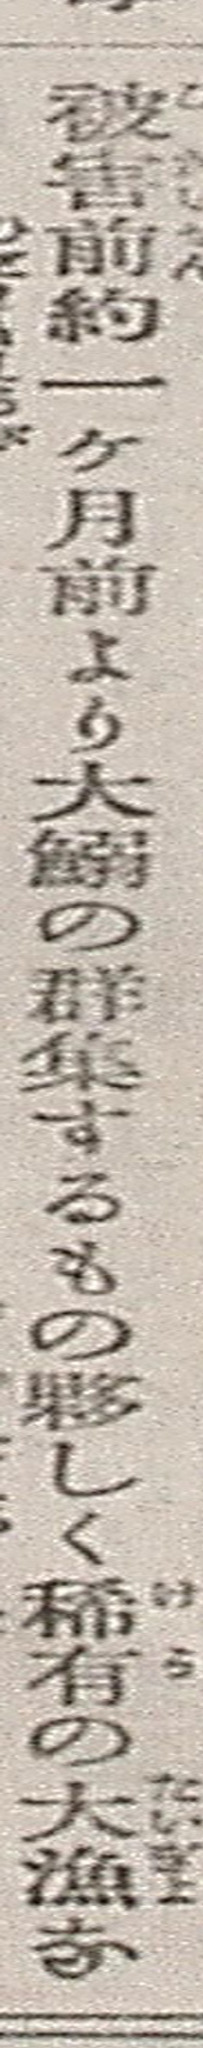被害前約一ケ月前より大鰯の群集するもの夥しく稀有の大漁な
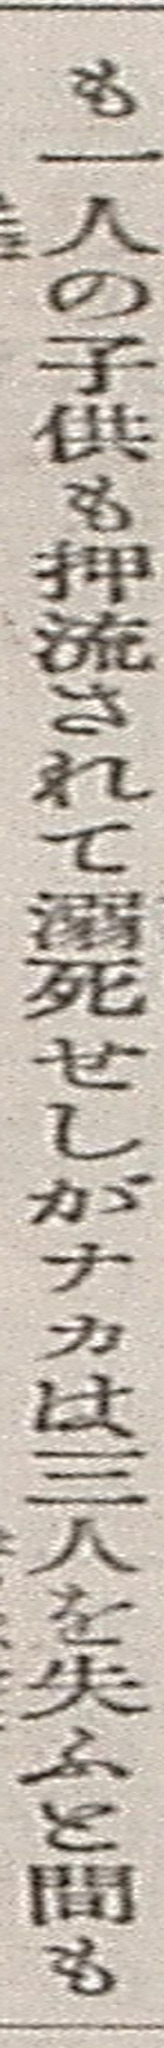も一人の子供も押流されて溺死せしがナカは三人を失ふと間も
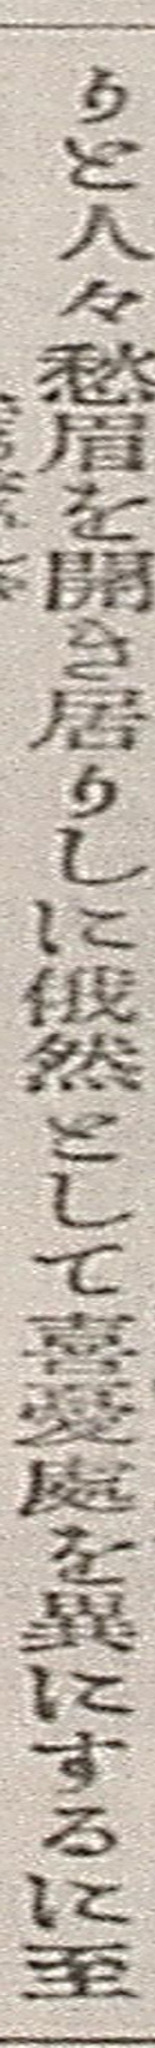りと人々愁眉を開き居りしに俄然として喜憂処を異にするに至
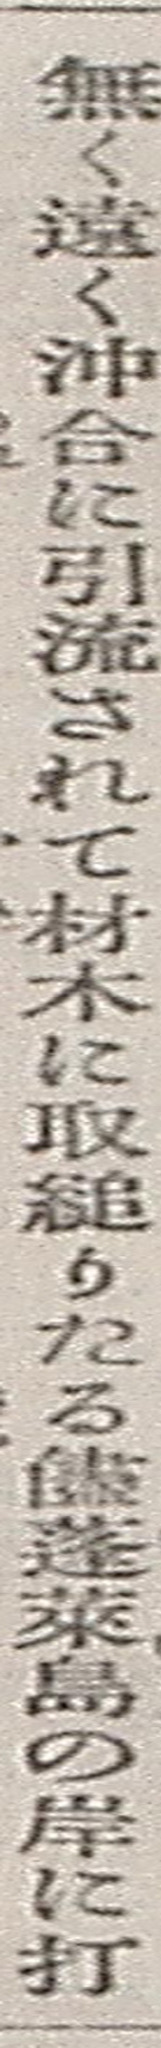無く遠く沖合に引流されて材木に取縋りたる侭蓬莱島の岸に打
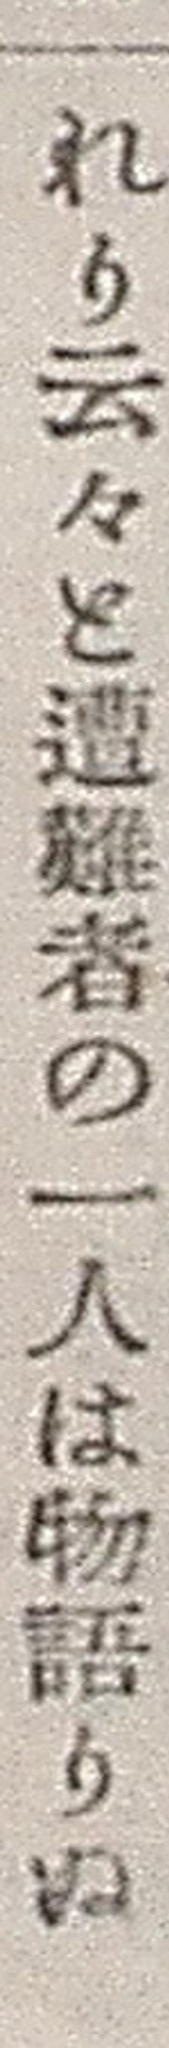れり云々と遭難者の一人は物語りぬ
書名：風俗畫報臨時増刊第百十九號　大海嘯被害録（中）
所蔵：東京大学地震研究所図書室 Earthquake Research Institute Library, The University of Tokyo, JAPAN
